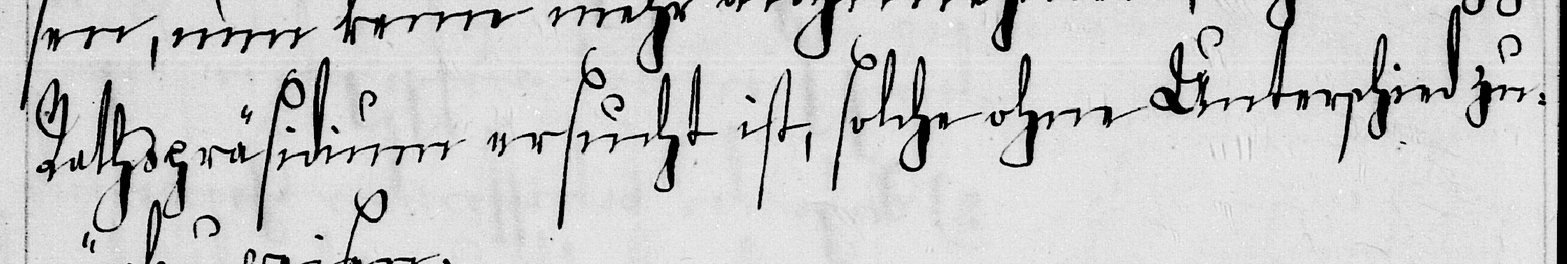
Rathspräsidium ersucht ist, solche ohne Unterschied z¬
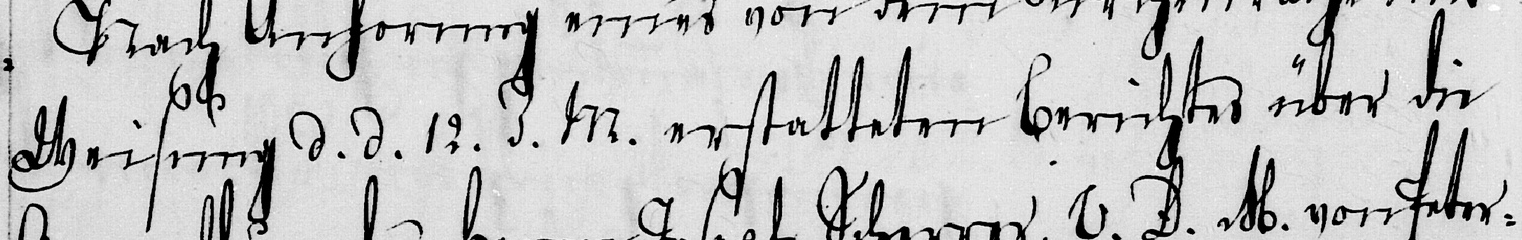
Weisung d. d. 12. d. M. erstatteten Berichtes über die
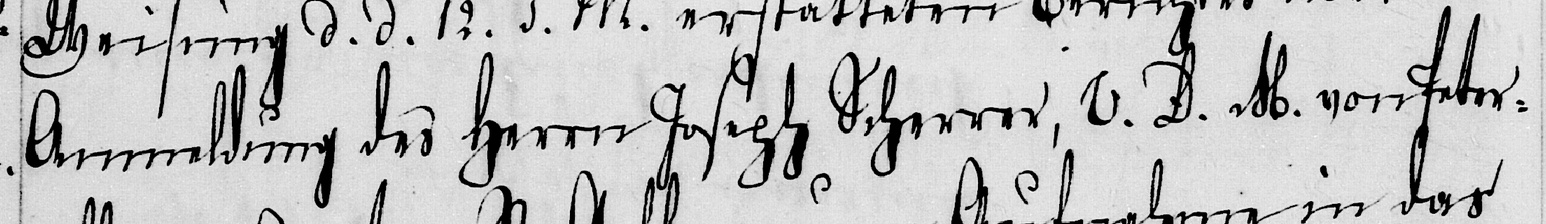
Anmeldung des Herrn Joseph Scherrer, V. D. M. von Peter¬
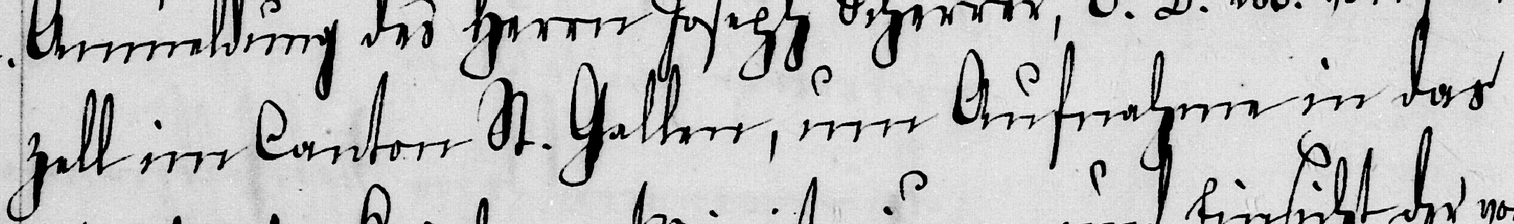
zell im Canton St. Gallen, um Aufnahme in das
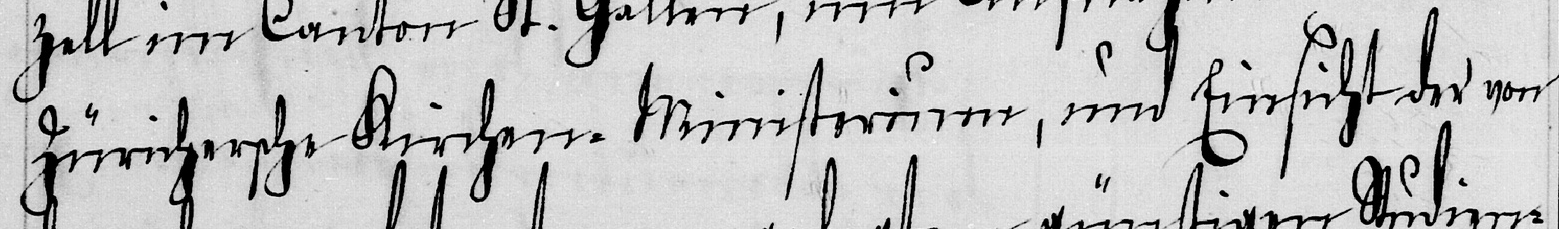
Zürichersche Kirchen-Ministerium, und Einsicht der von
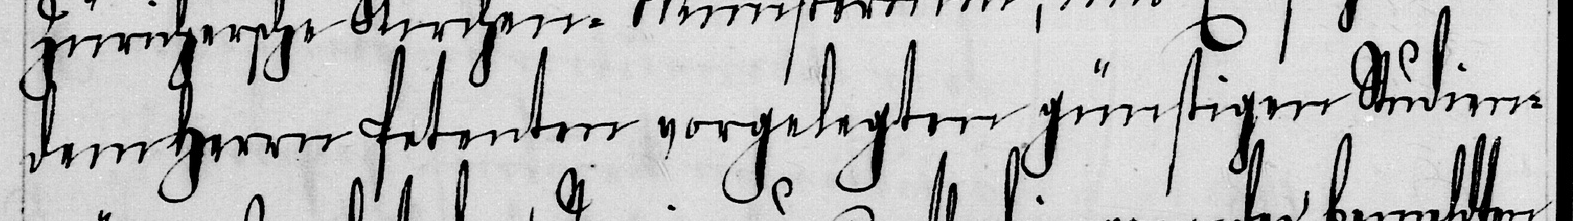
dem Herrn Petenten vorgelegten günstigen Studien¬
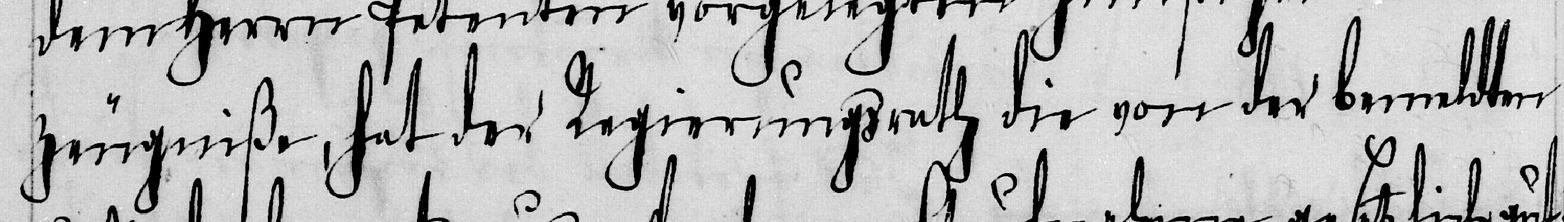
zeugniße, hat der Regierungsrath die von der bemeldten
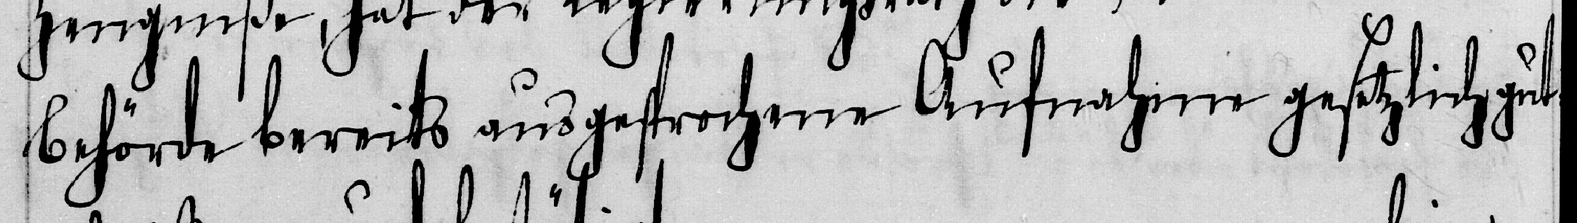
Behörde bereits ausgesprochene Aufnahme gesetzlich
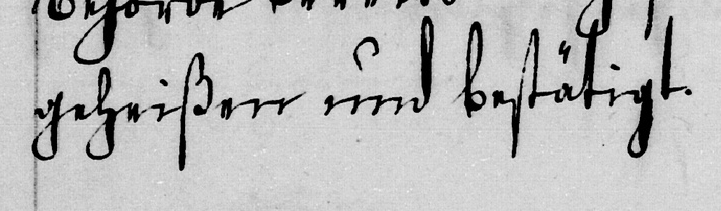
geheißen und bestätigt.
